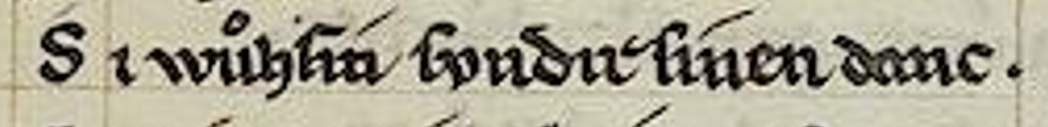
Si wu°ohſin ſvndir ſinen danc.
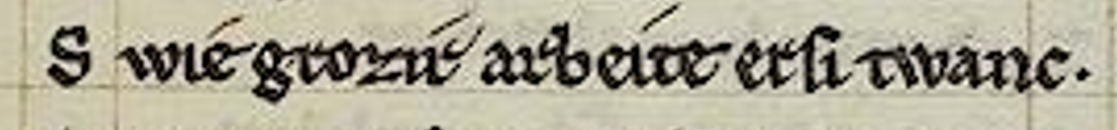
Swie grozir arbeite erſi twanc.
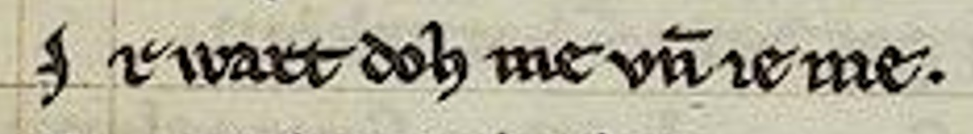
Ir wart doh me vn(d) ie me.
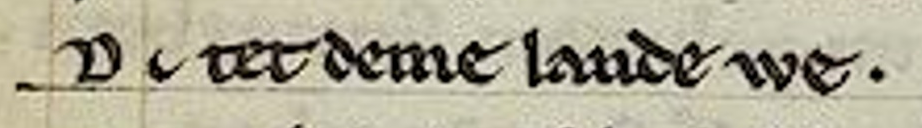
D(az) tet deme lande we.
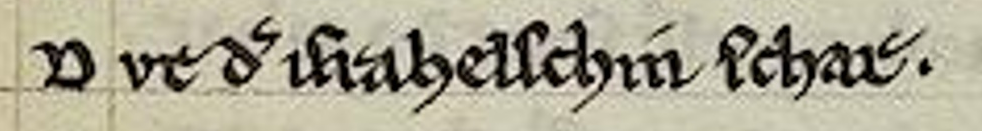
Dvr d(er) iſrahelſchin ſchar.
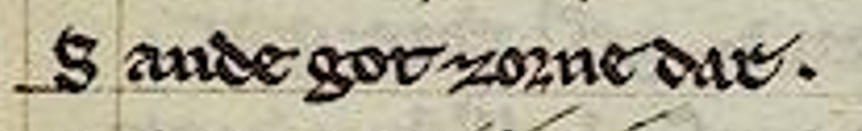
Sande got zorne dar.
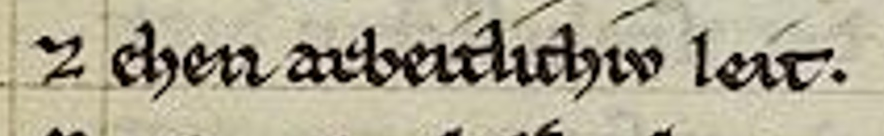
Zehen arbeitlichiv leit.
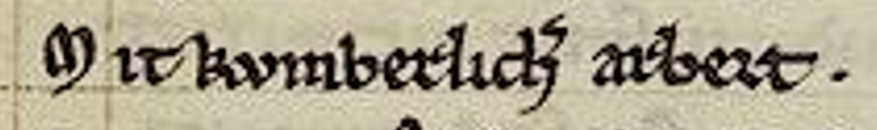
Mit kvmberlich(er) arbeit.
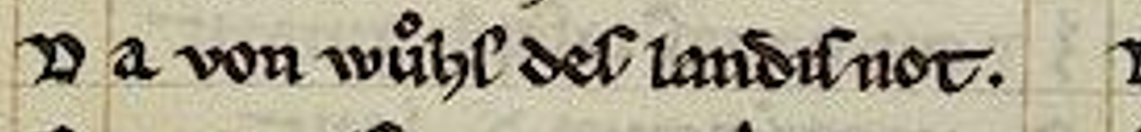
Da von wu°ohſ deſ landiſ not.
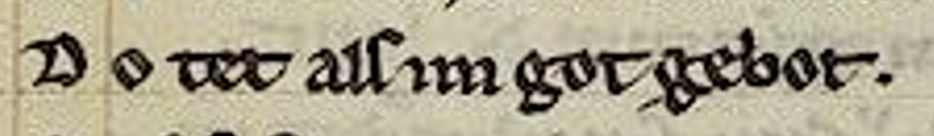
Do tet alſ im got gebot.
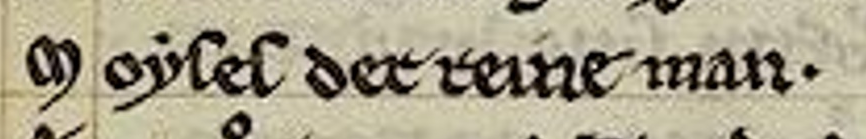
Moyſeſ der reine man.
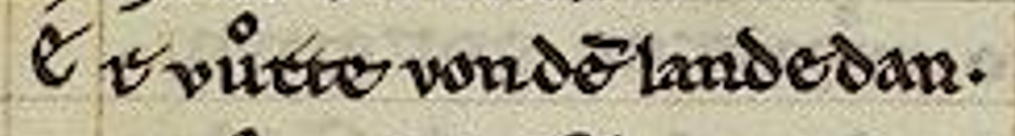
Er vu°orte von de(m) lande dan.
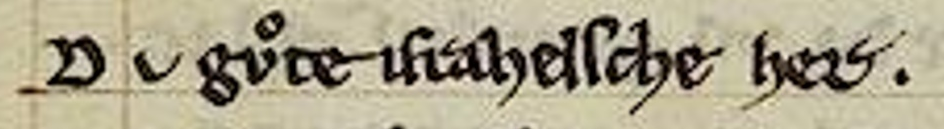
D(az) gv°ote iſrahelſche her.
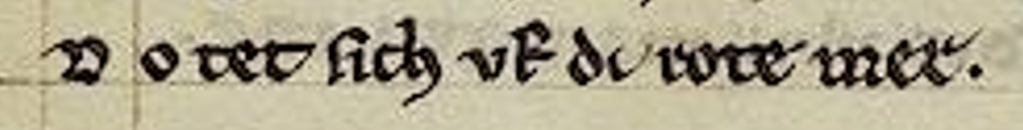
Do tet ſich vf d(az) rote mer.
